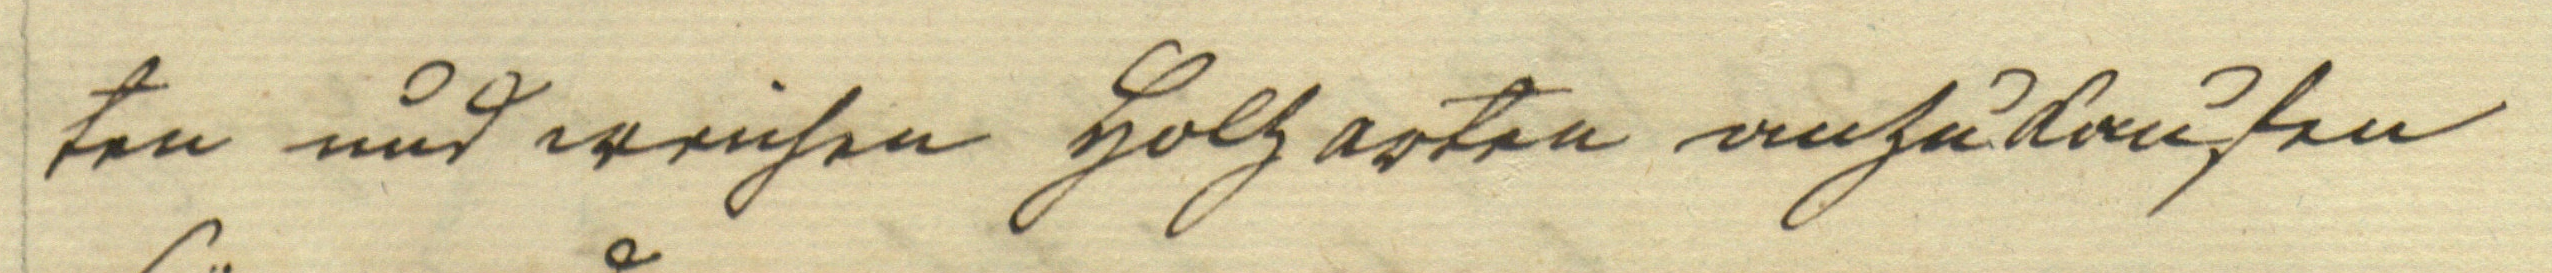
ten und weichen Holzarten anzukaufen
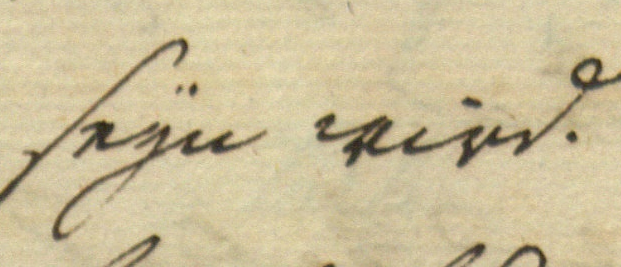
seÿn wird.
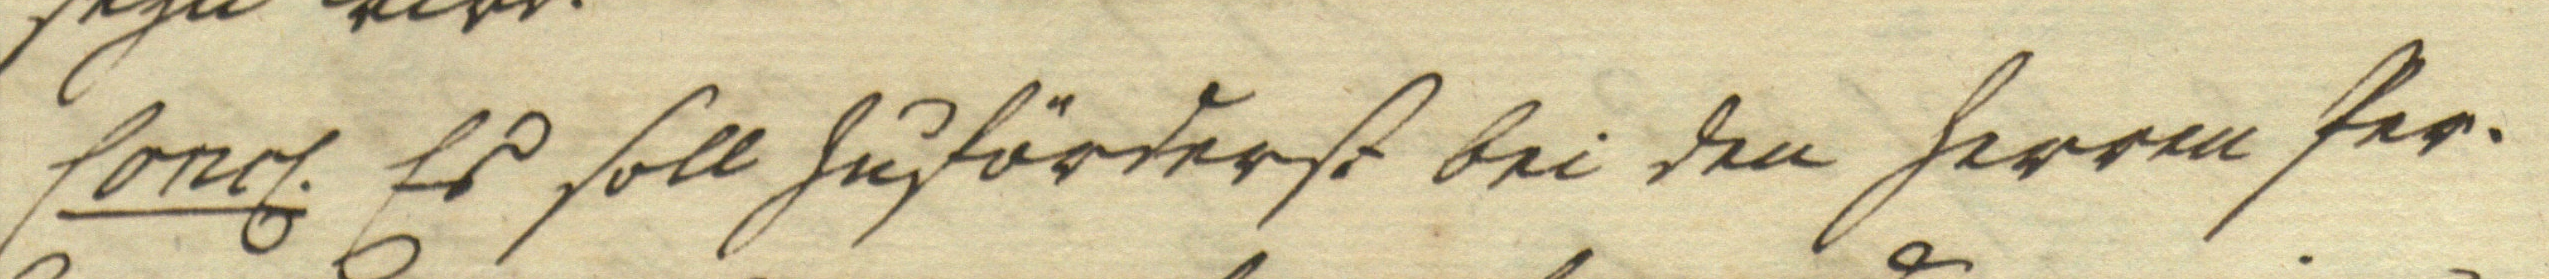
Concl. Es soll zuförderst bei den Herren Per¬
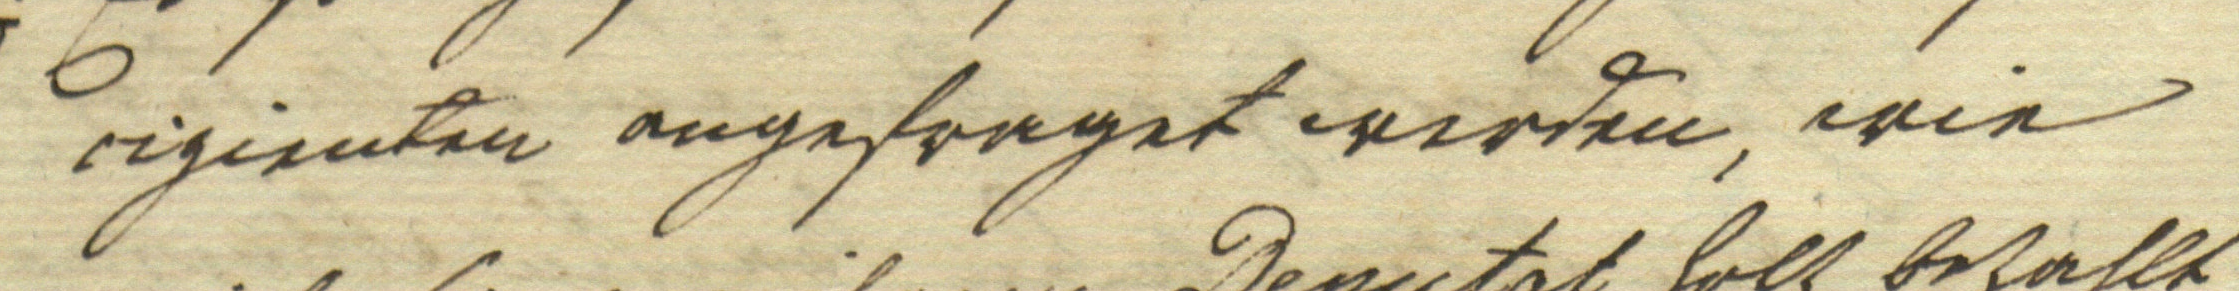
cigienten angefraget werden, wie
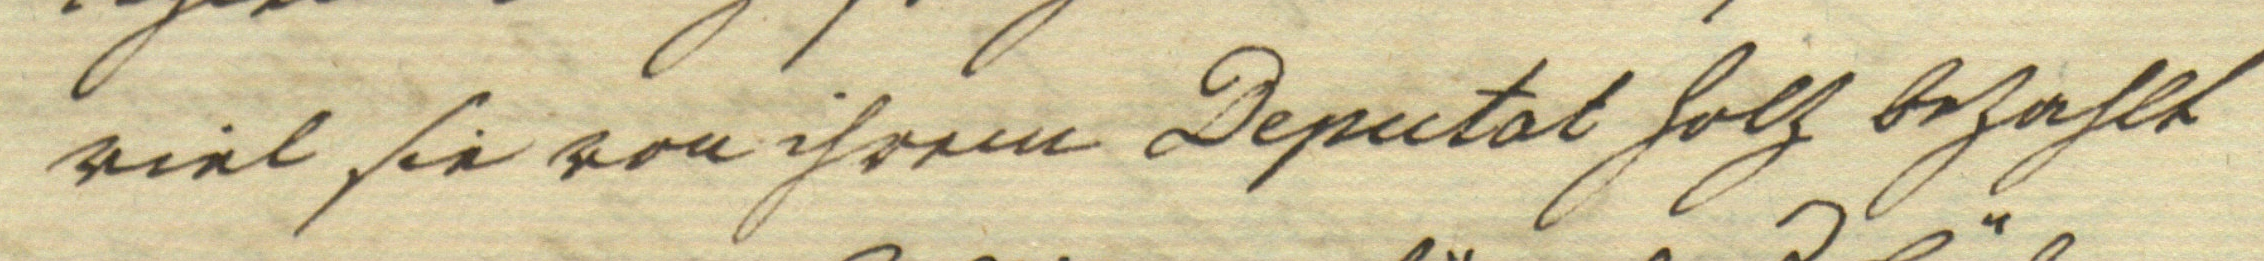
viel sie von ihrem Deputat Holz bezahlt
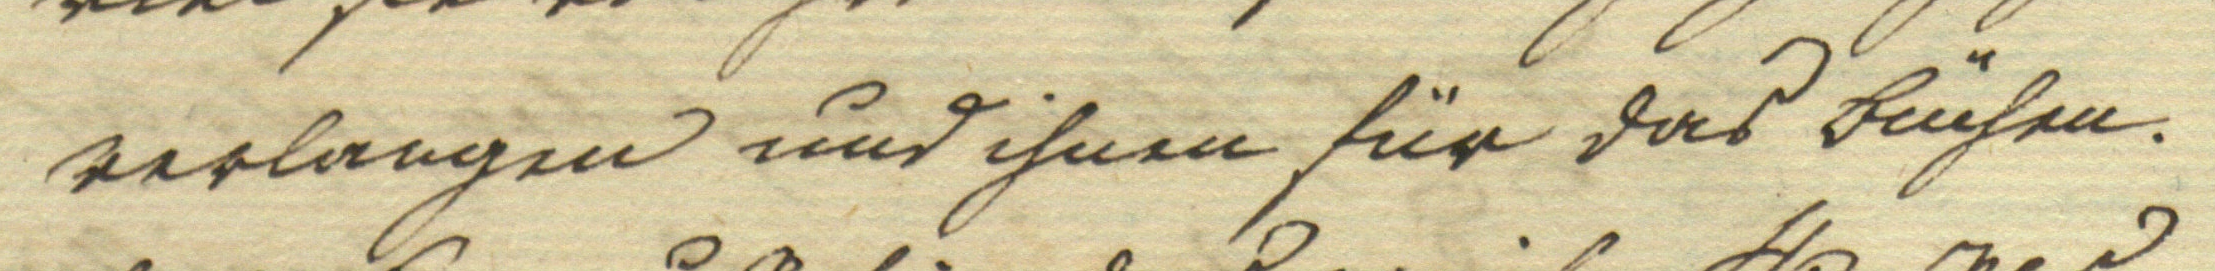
verlangen und ihnen für das Büchen¬
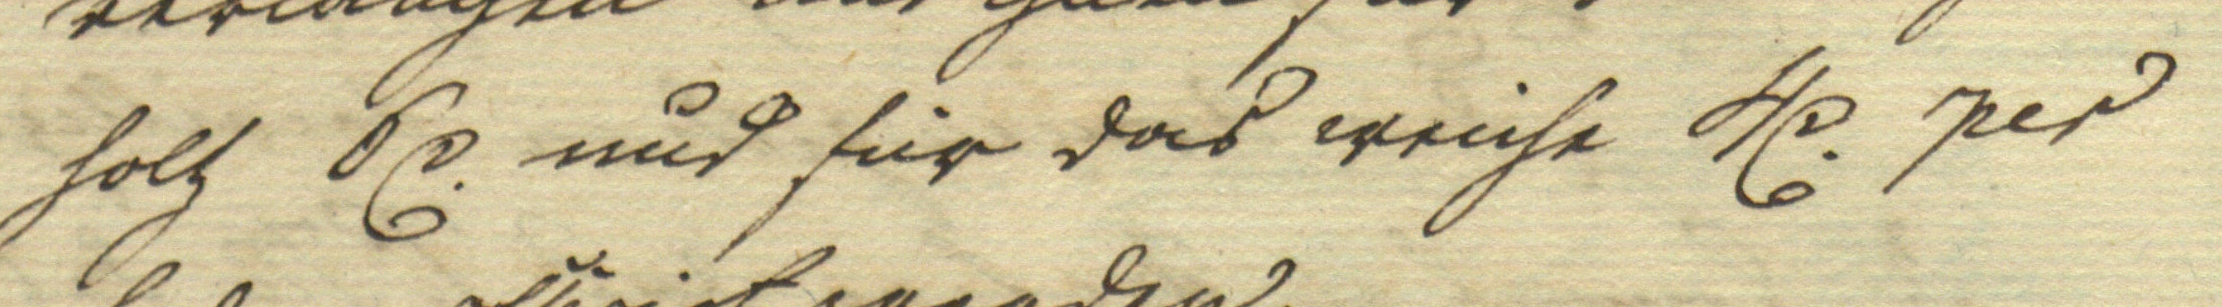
holz 6 l. und für das weiche 4 l. per
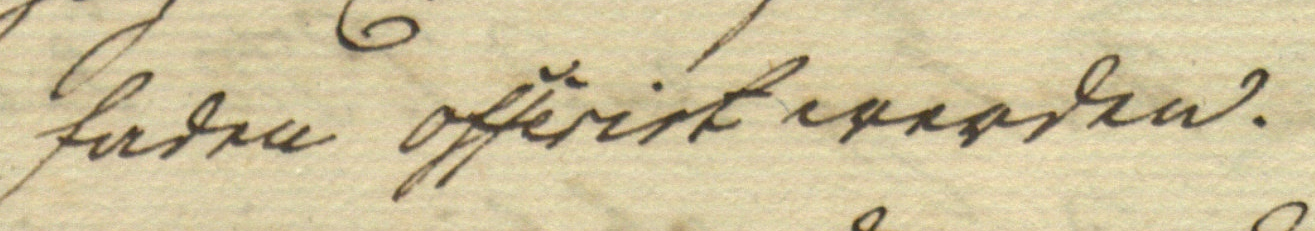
Faden offerirt werden.
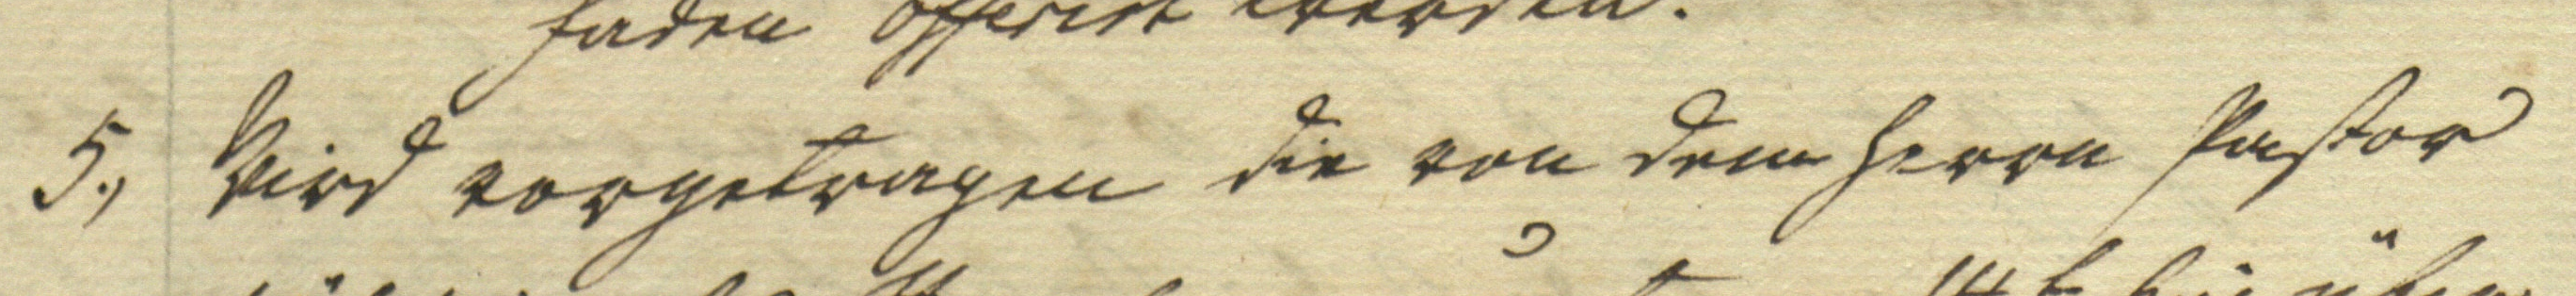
5., Wird vorgetragen die von dem Herrn Pastor
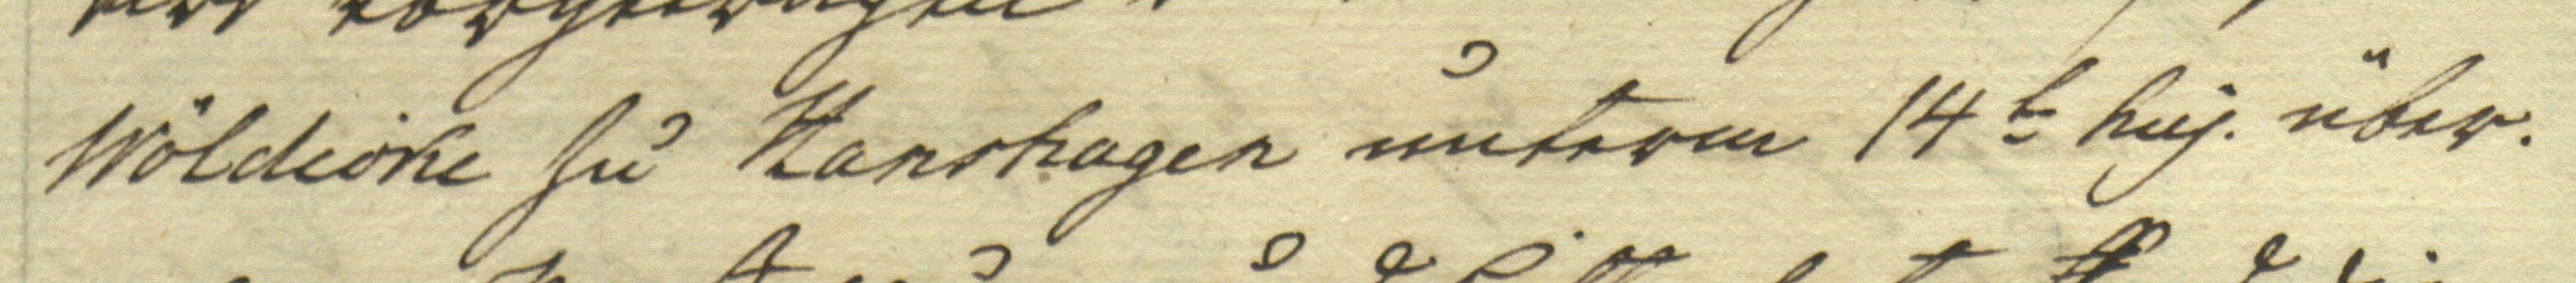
Wöldicke zu Hanshagen unterm 14 t huj. über¬
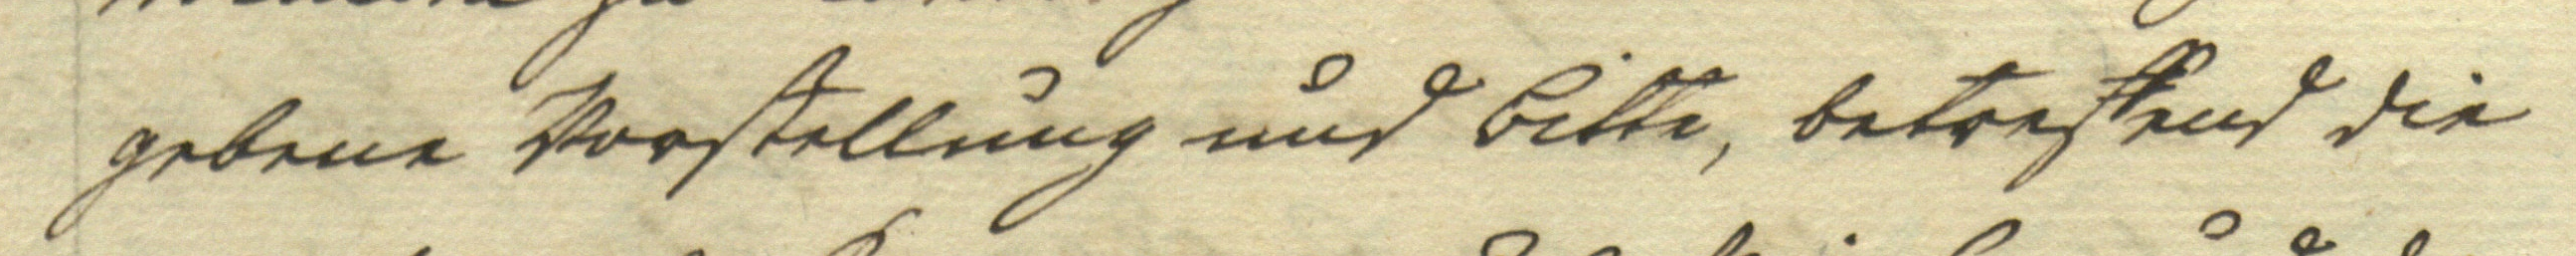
gebene Vorstellung und Bitte, betreffend die
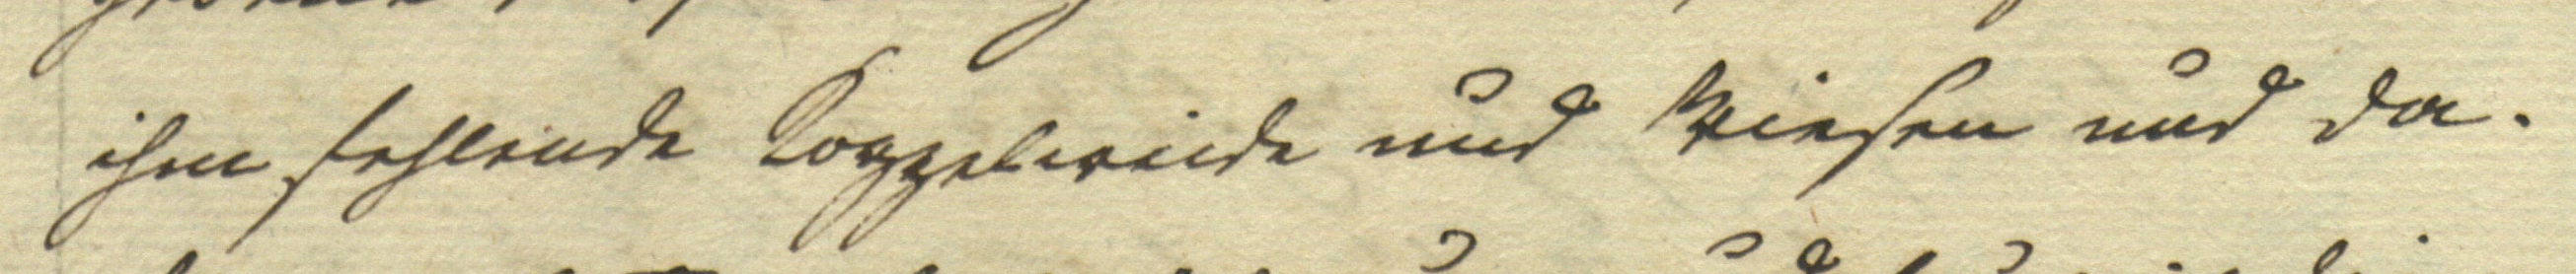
ihm fehlenden Koppelweide und Wiesen und da¬
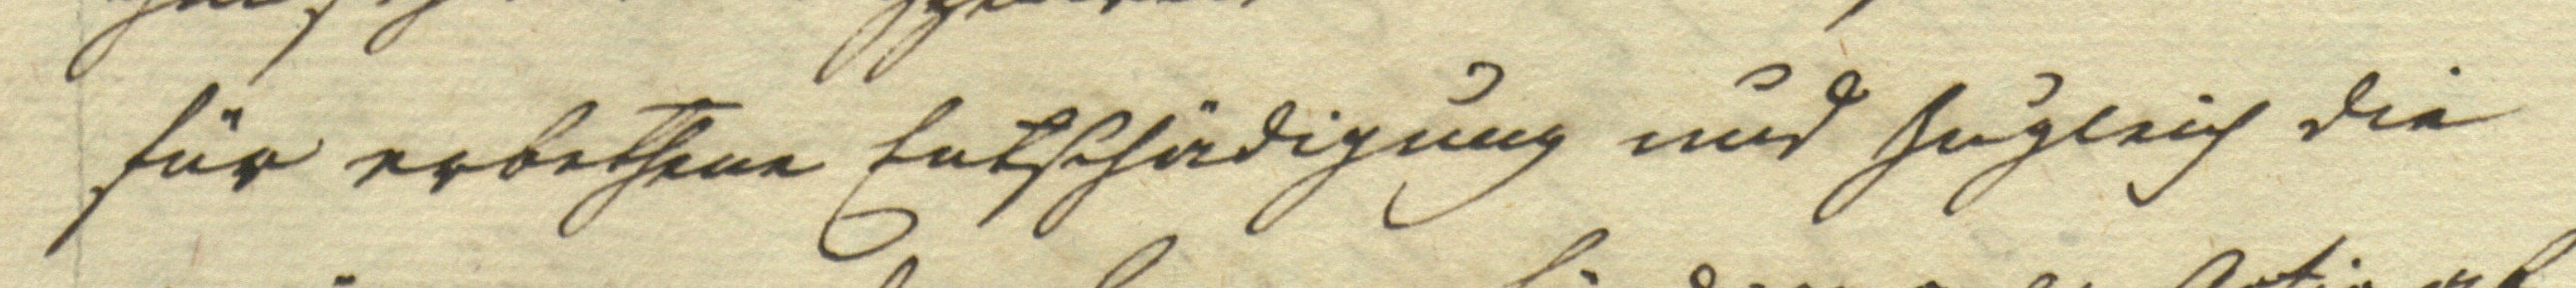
für erbethene Entschädigung und zugleich die
